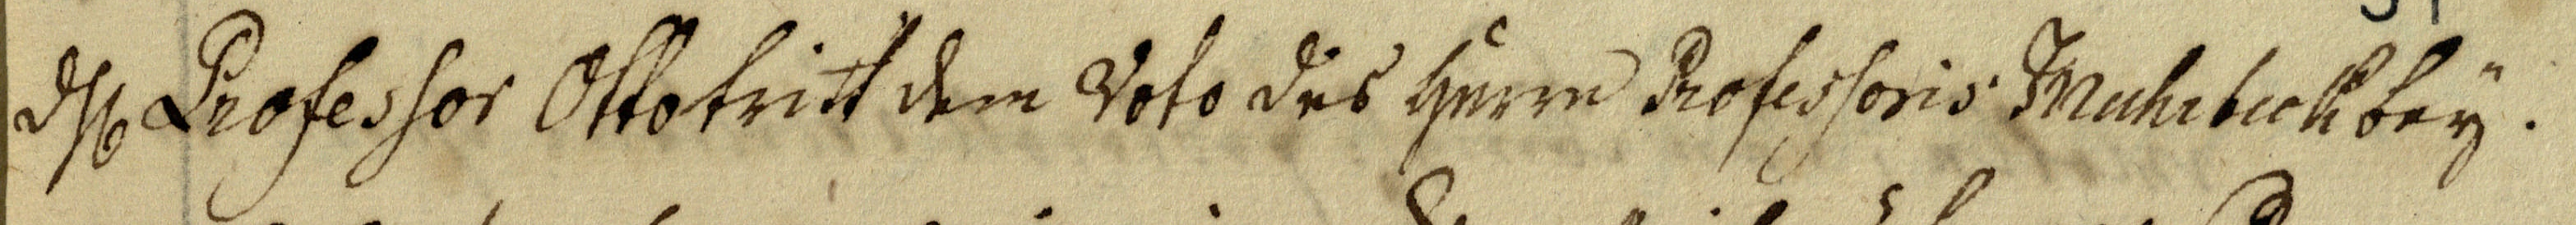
dh Professor Otto tritt dem Voto des Herrn Professoris Muhrbeck beÿ.
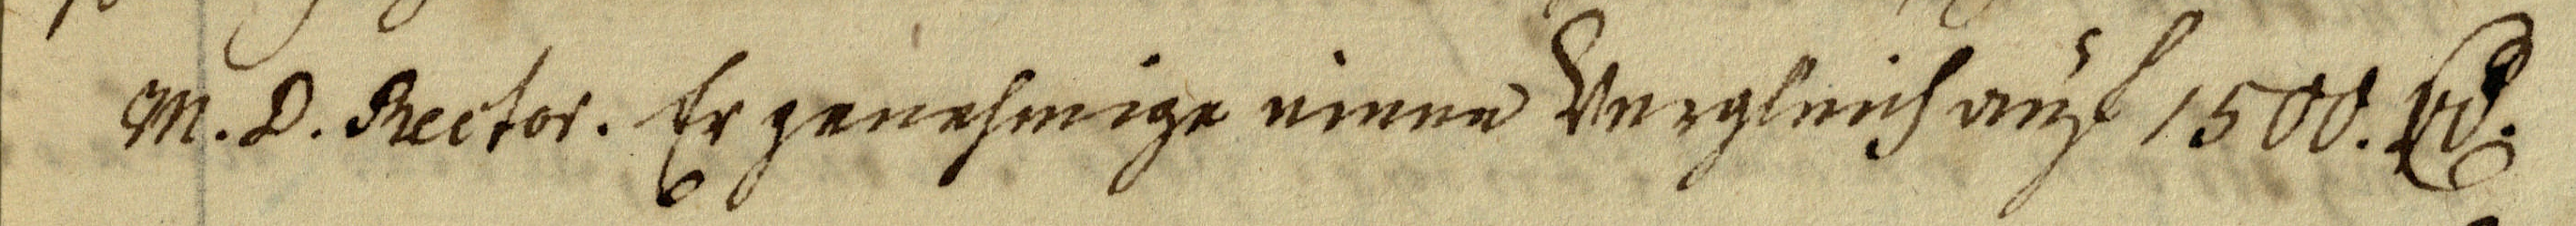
M. D. Rector. Er genehmige einen Vergleich auf 1500 r.
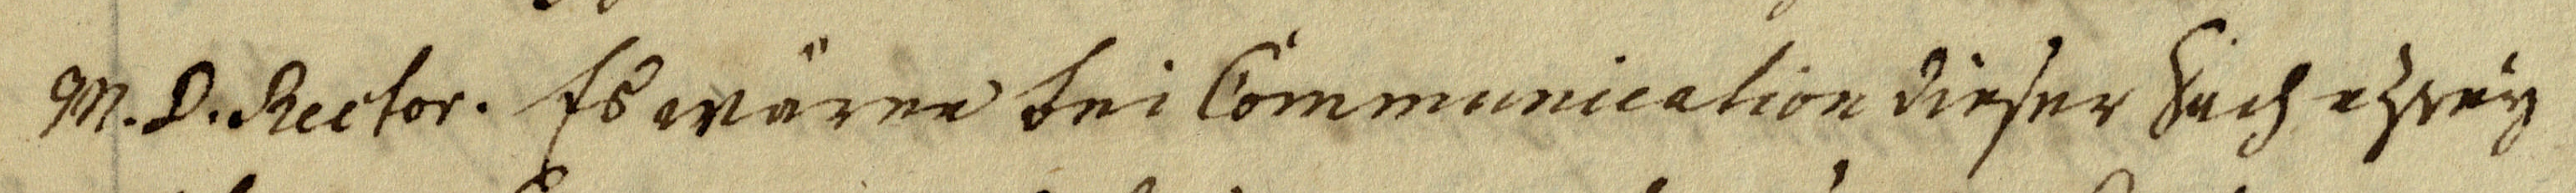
M. D. Rector. Es wären bei Communication dieser Sache zweÿ
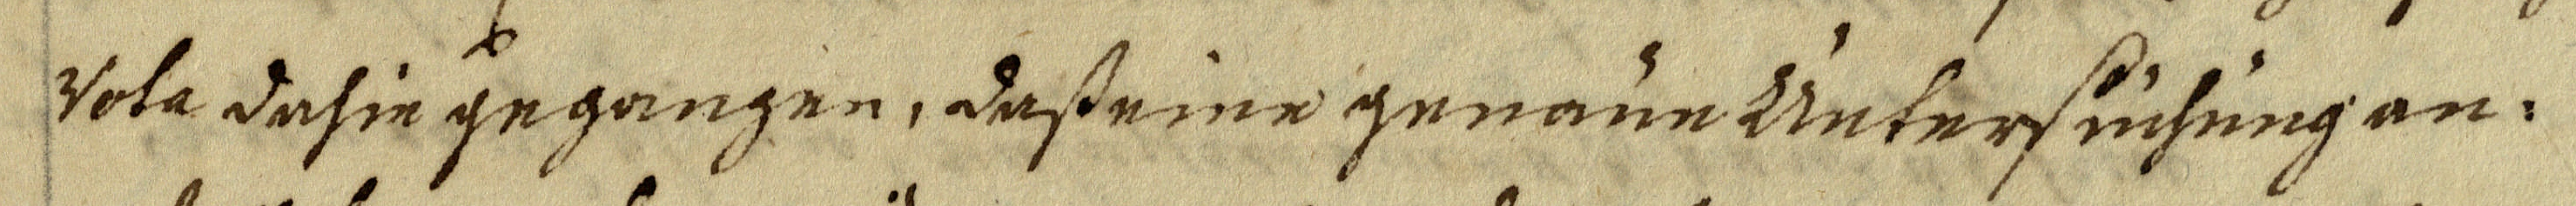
Vota dahin gegangen, daß eine genaue Untersuchung an¬
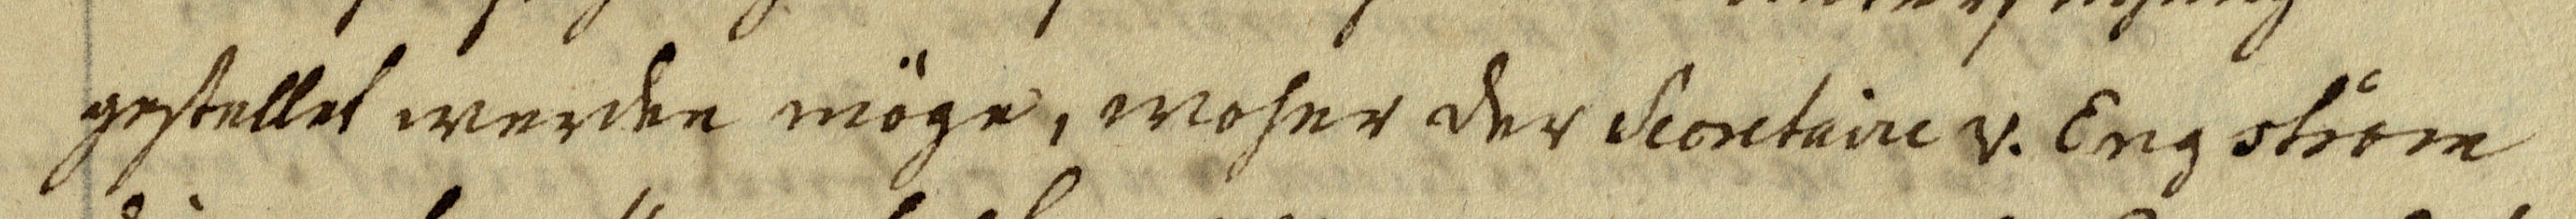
gestellet werden möge, woher der Secretaire v. Engström
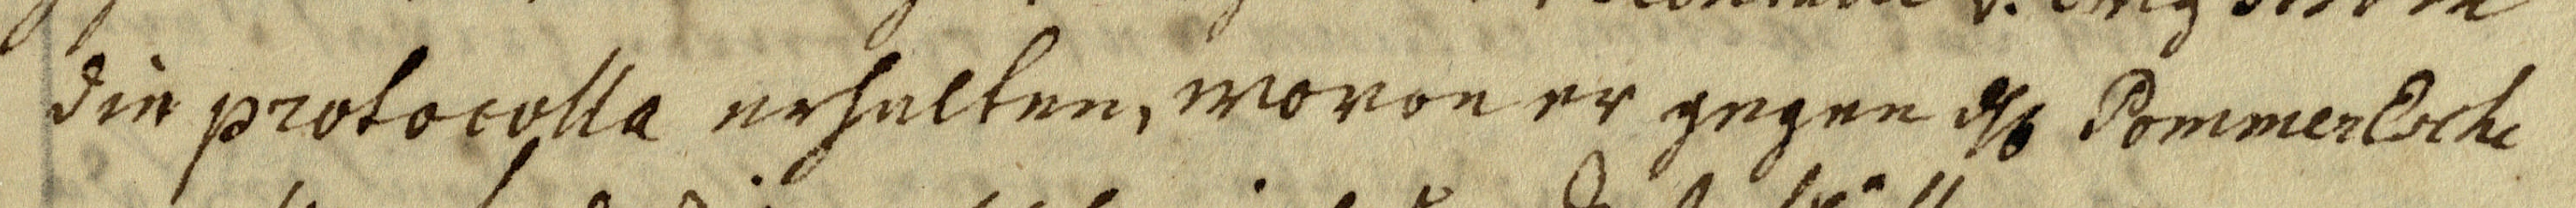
die protocolla erhalten, wovon er gegen dh PommerEsche
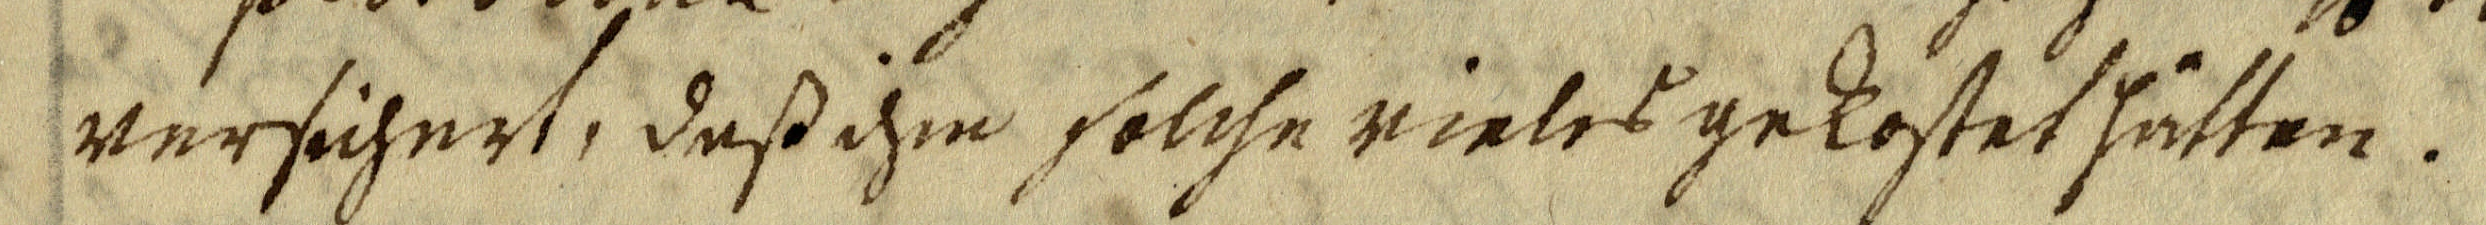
versichert, daß ihm solche vieles gekostet hätten.
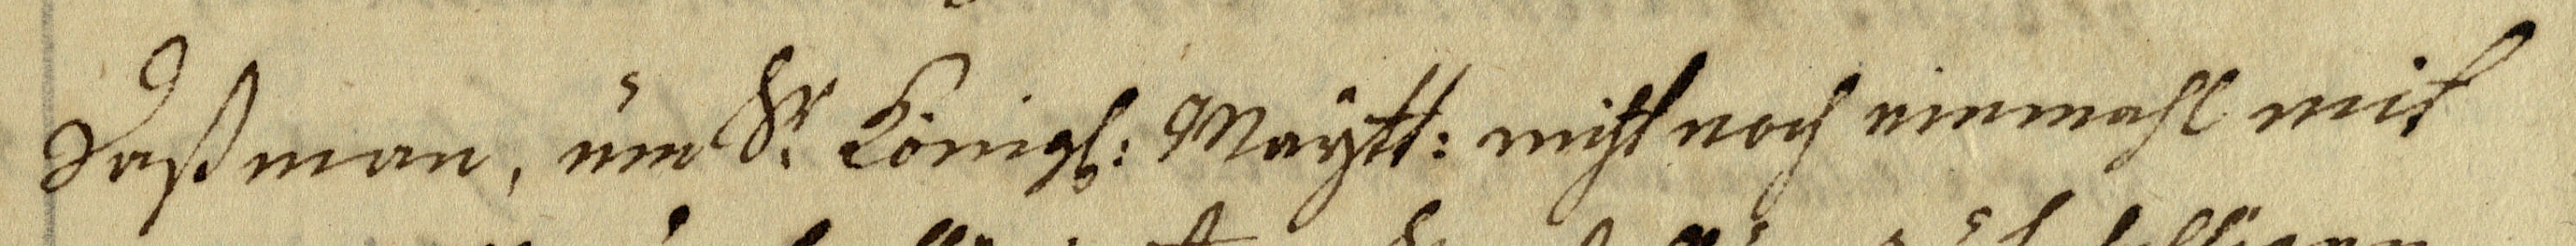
Daß man, um Sr Königl. Maÿtt. nicht noch einmahl mit
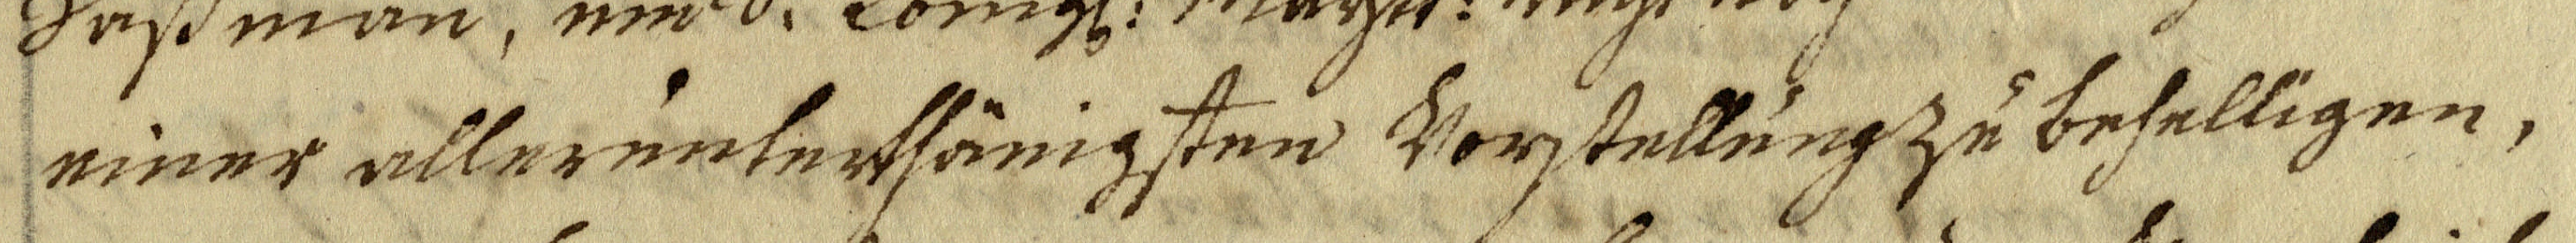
einer allerunterthänigsten Vorstellung zu behelligen,
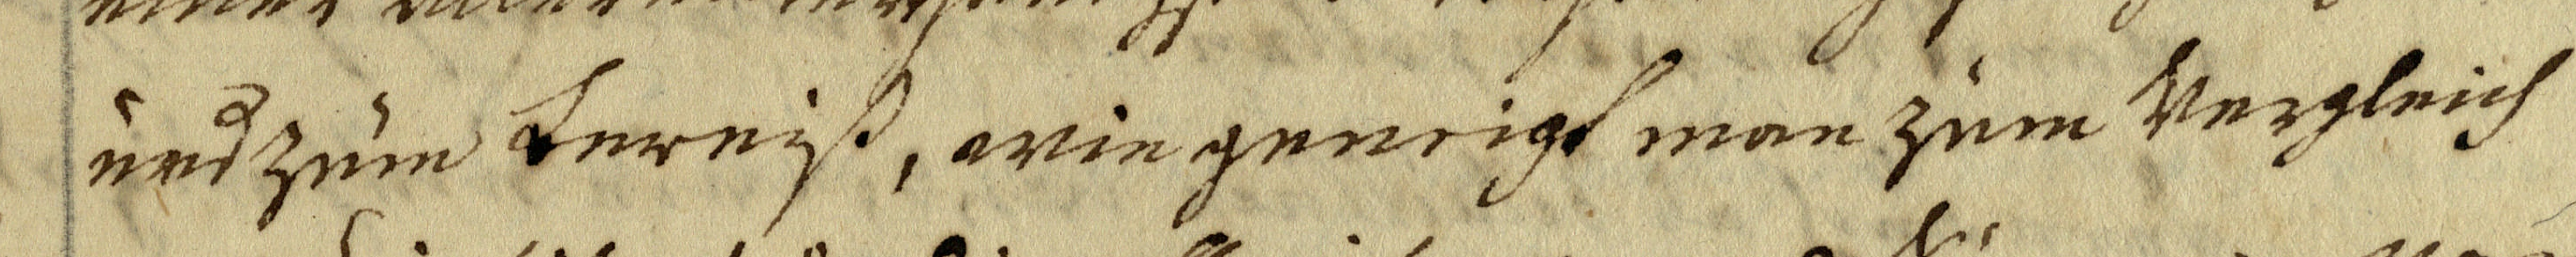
und zum Beweiß, wie geneigt man zum Vergleich
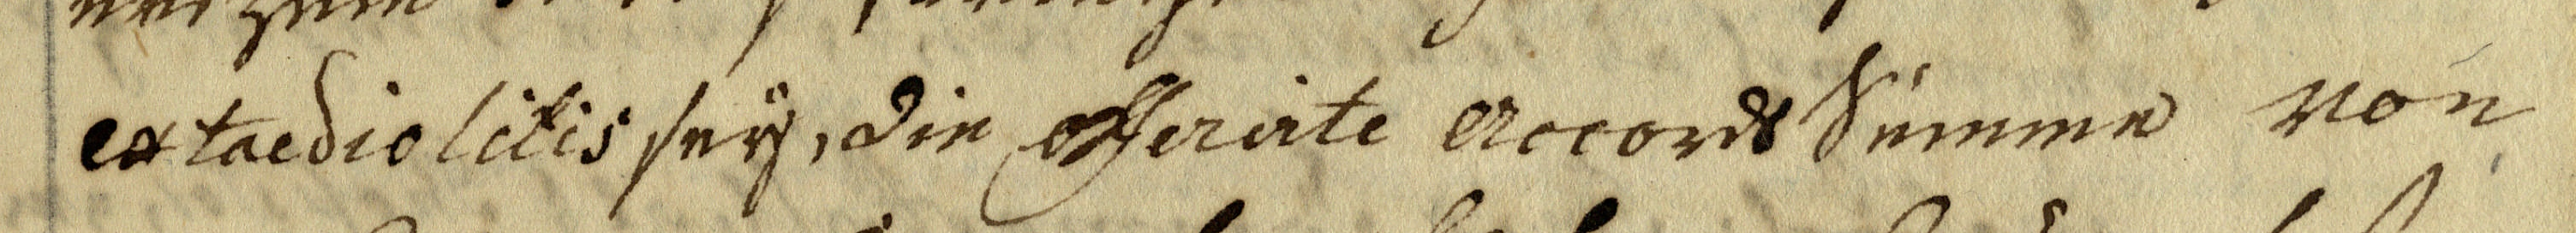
ex taedio litis seÿ, die offerirte AccordsSumme von
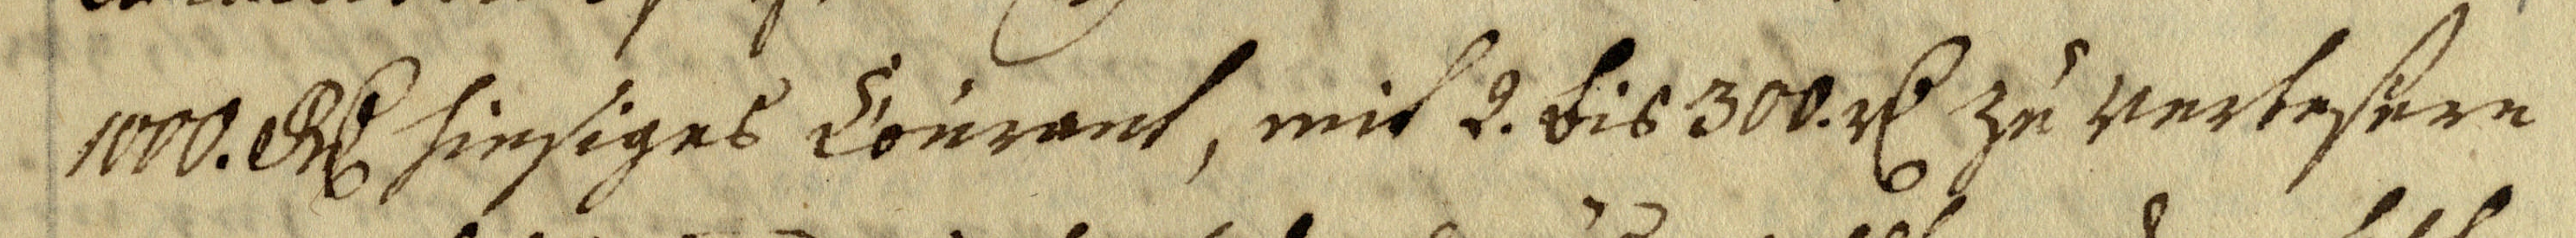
1000. R. hiesiges Courant, mit 2. bis 300 r. zu verbeßern
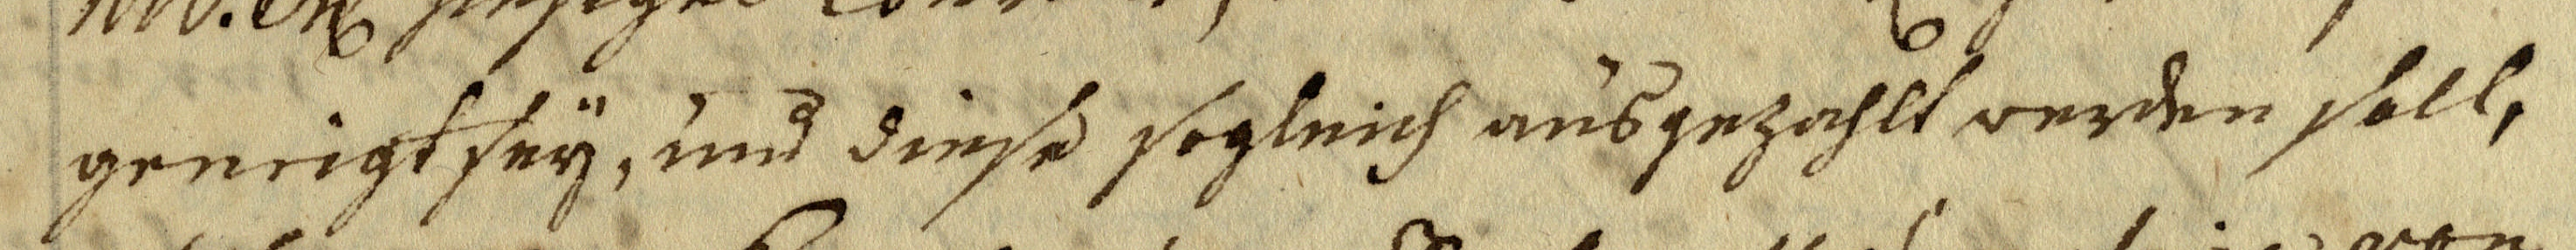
geneigt seÿ, und diese sogleich ausgezahlt werden soll,
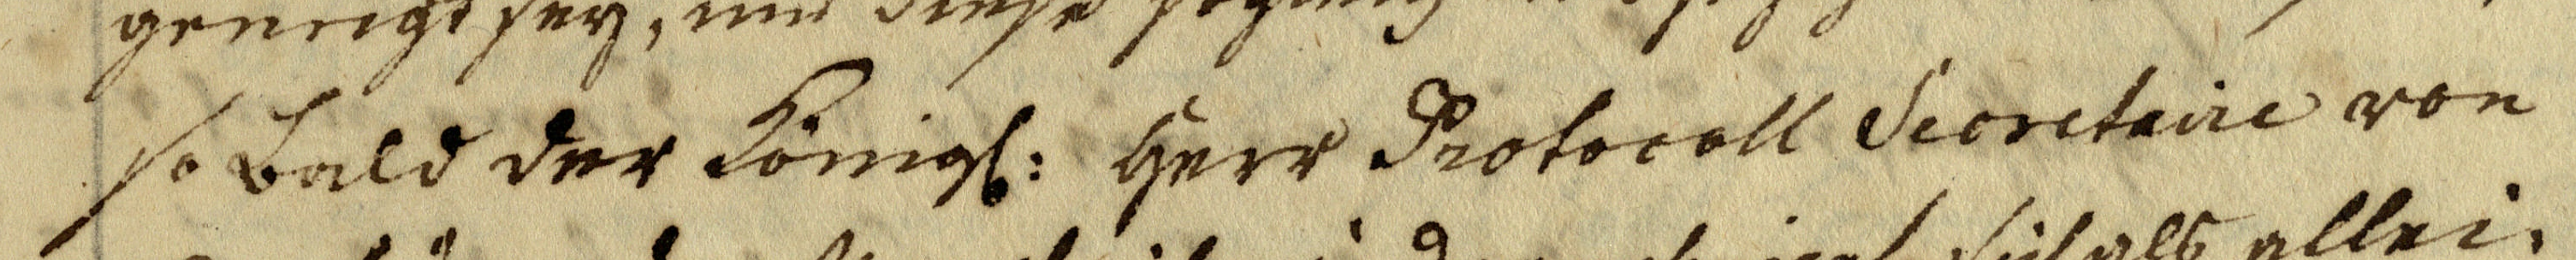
so bald der Königl. Herr Protocoll Secretaire von
